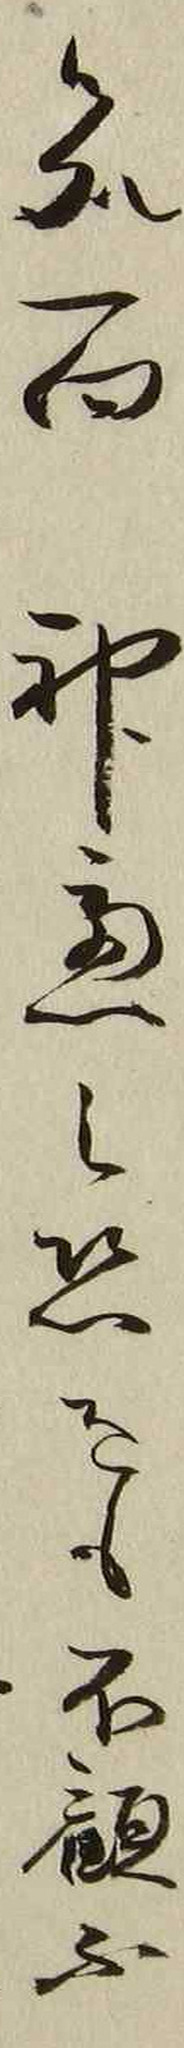候処一向神慮之恐をも不顧不
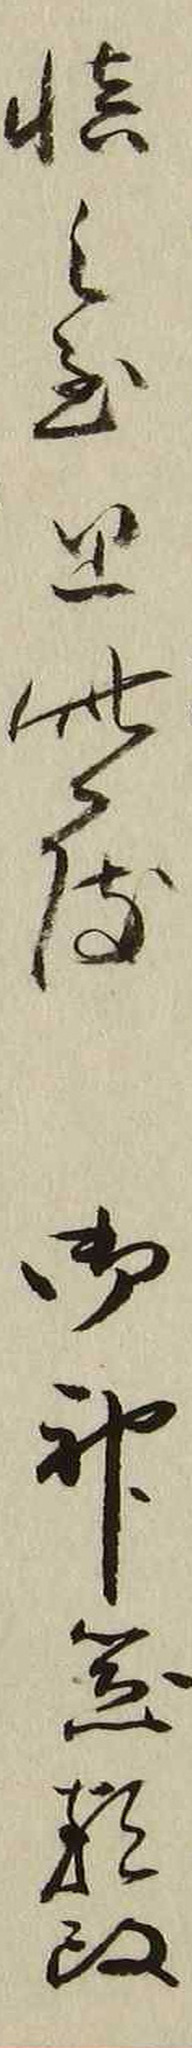慎之至且此度御神器類改
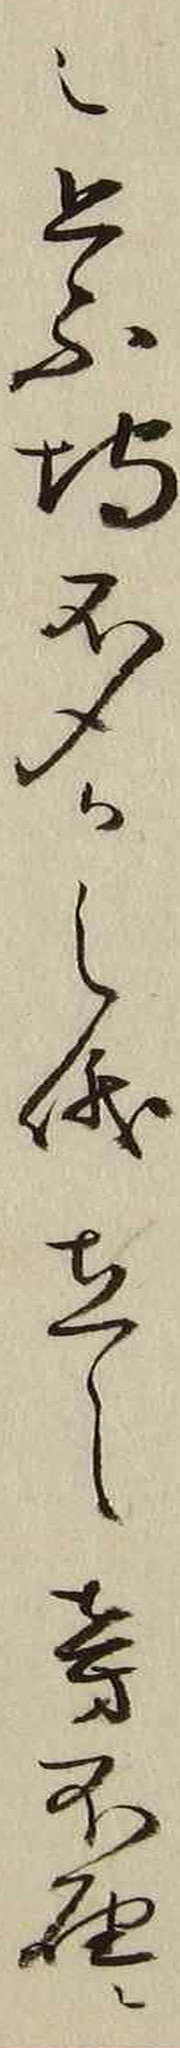之上不埒不〆り之儀在之旁不届ニ
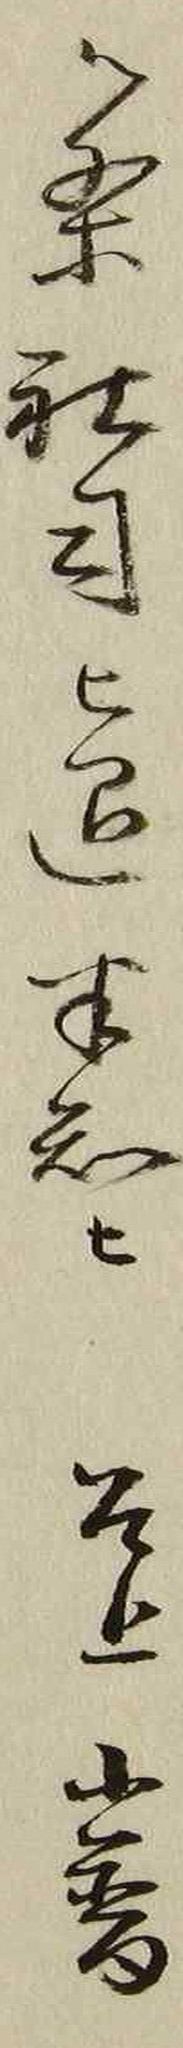候条社司被退半知被召上小普
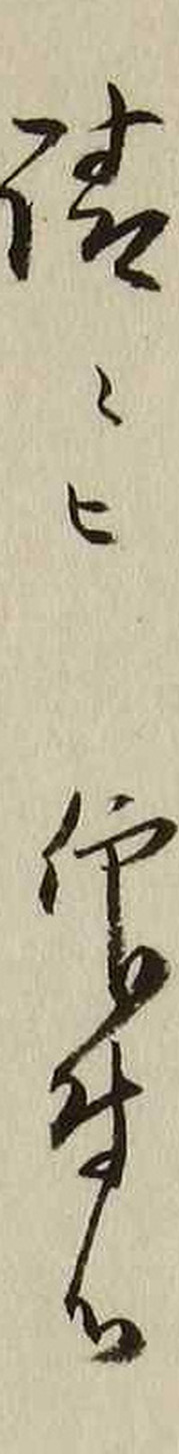請ニ被仰付候
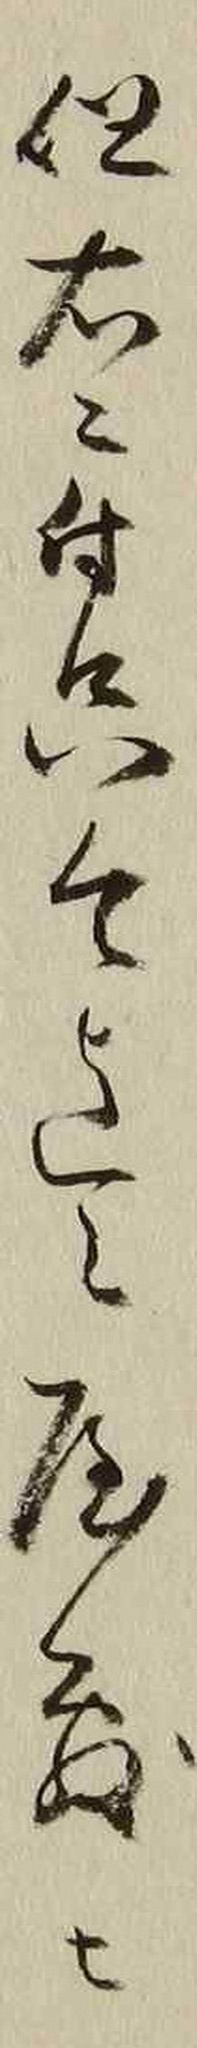但右ニ付只今迄之屋敷被
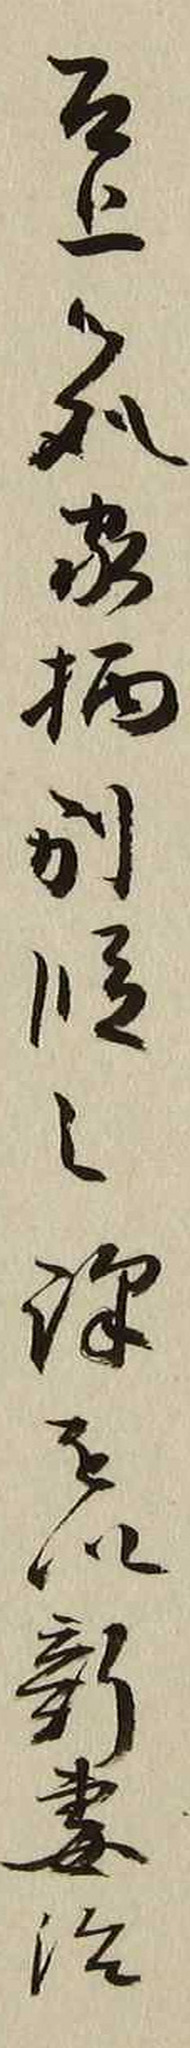召上候処家柄別段之訳を以新妻治
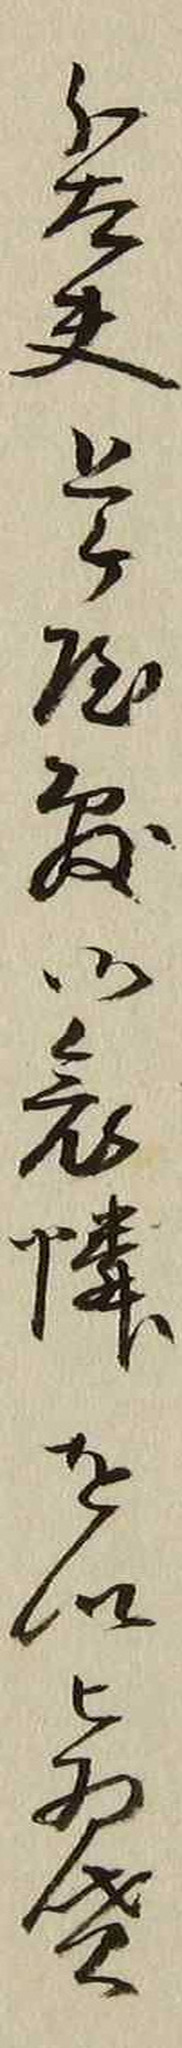郎太夫上ヶ屋敷御哀憐を以被為貸
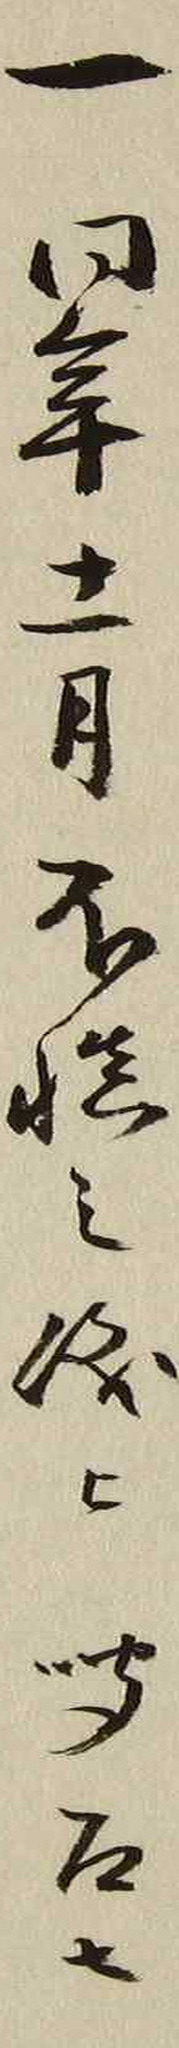一同年十一月不慎之儀被聞召被
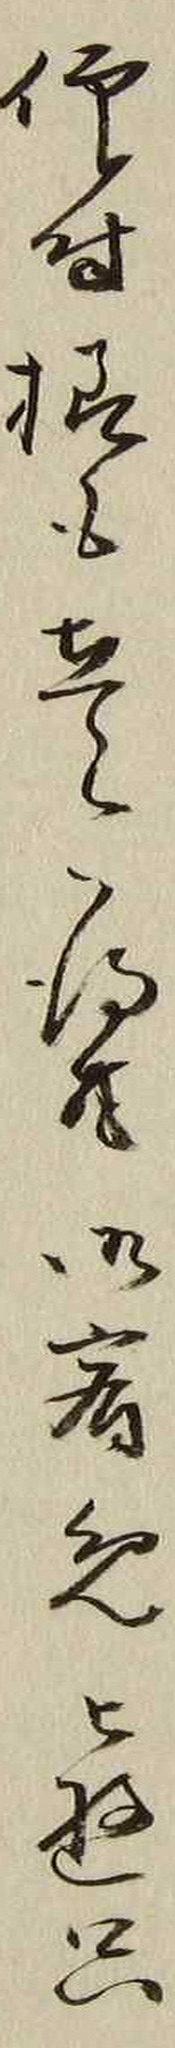仰付様も在之候得共御宥免被遊只
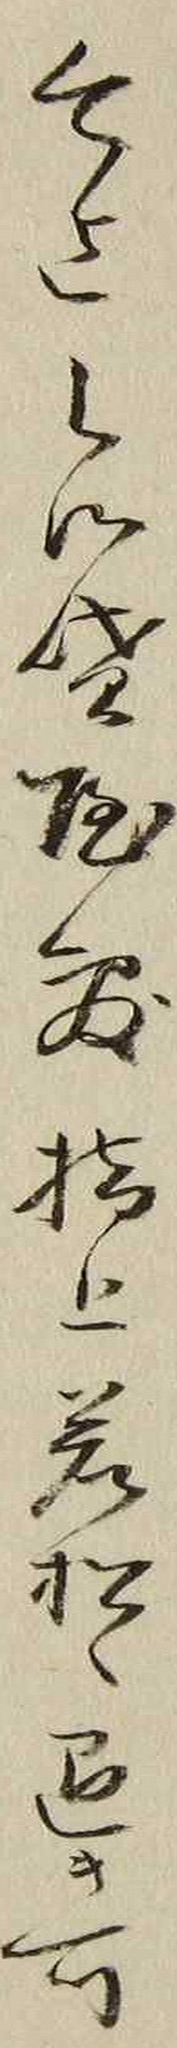今迄之御貸屋敷指上若松へ退キ可
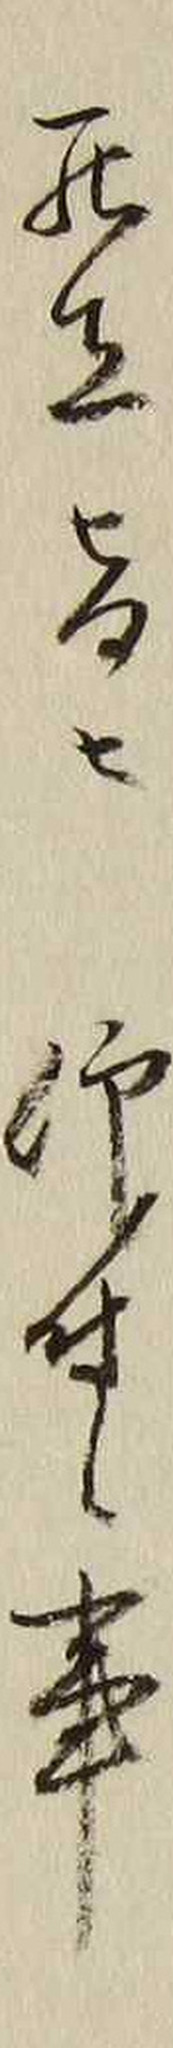罷在旨被仰付候事
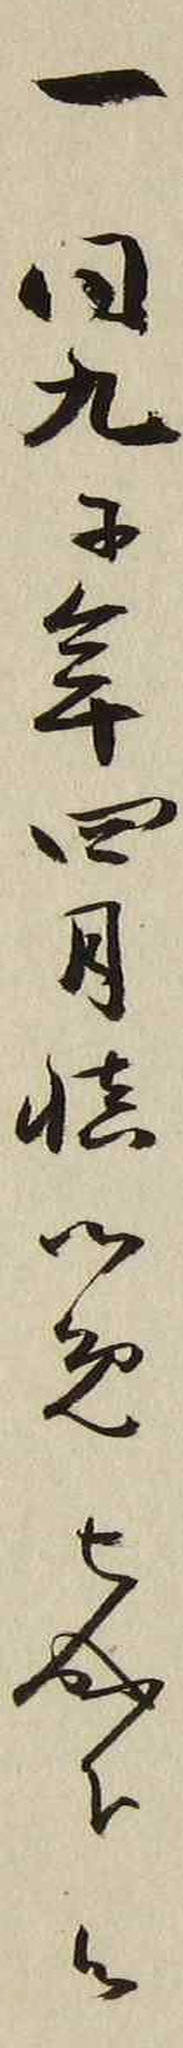一同九子年四月慎御免被成下候
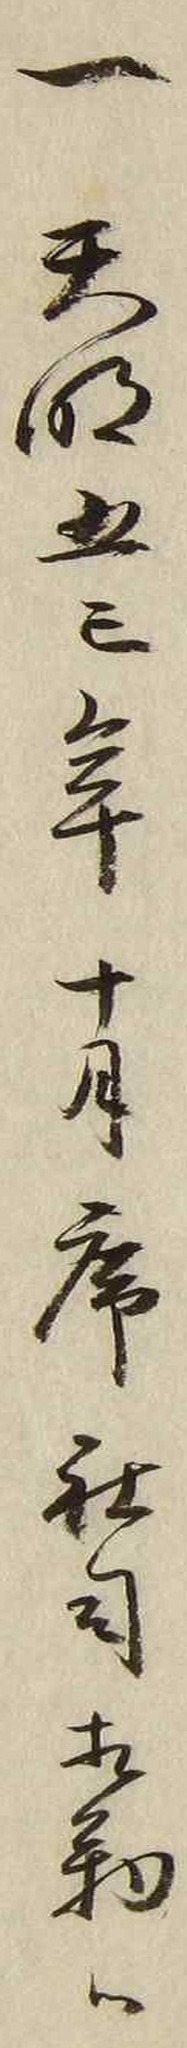一天明五巳年十月席社司相勤候

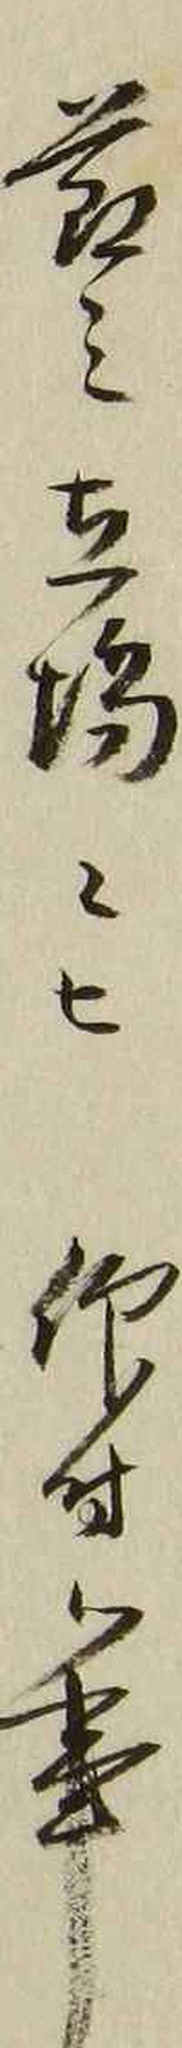節之立場ニ被仰付候事
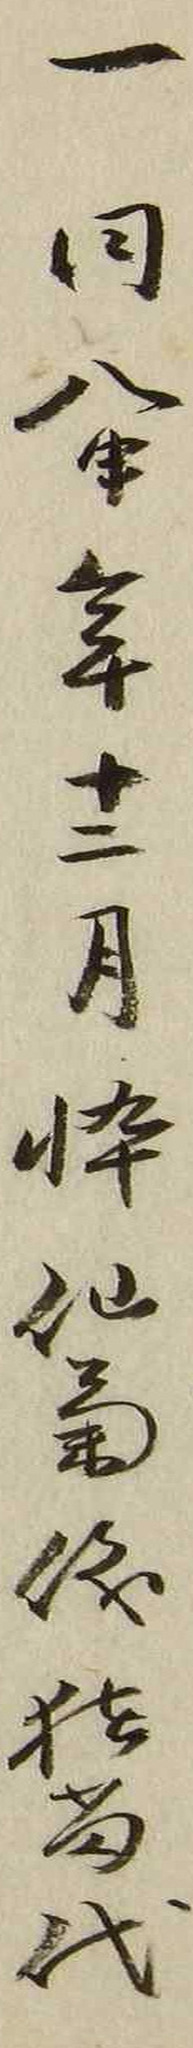一同八申年十二月忰仙菊儀猪苗代
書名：諸士系譜　巻之291　さ之部23
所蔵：会津若松市立会津図書館
